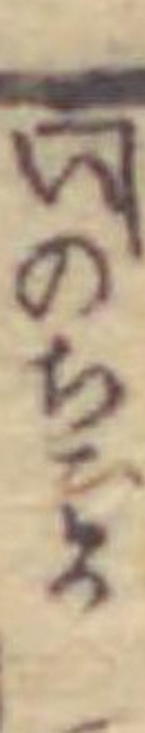〽いのちばか
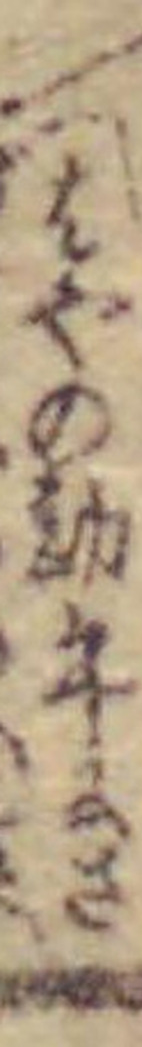〽はやの勘午にさ
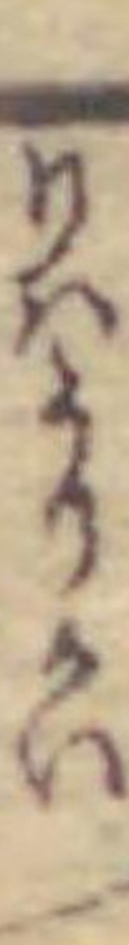りはうりかい
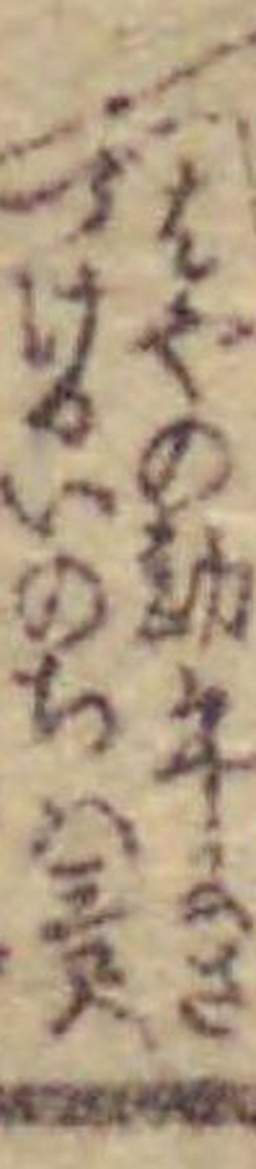づけるいのちは三尺
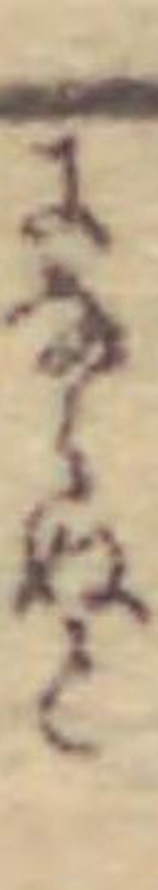にならぬと
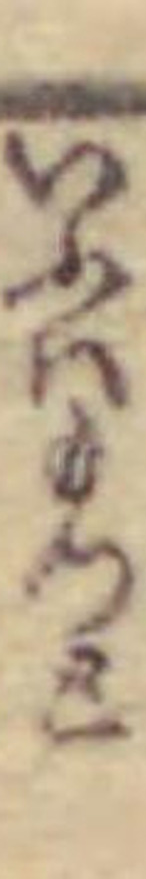いふはもつと
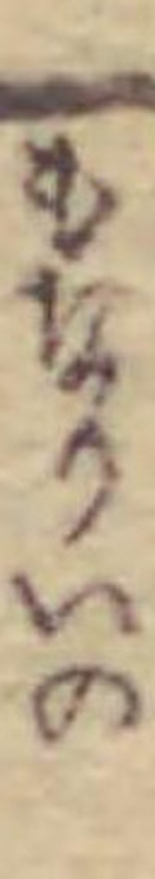もなりいの
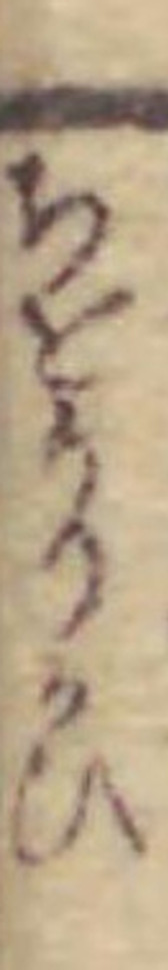ちをうりかひ
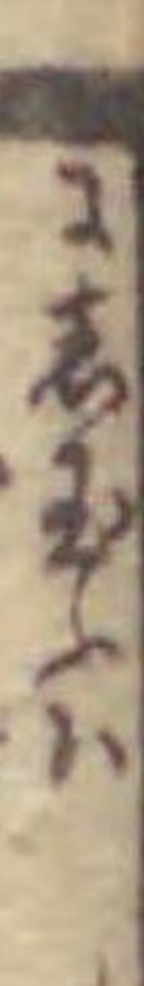にし玉ふは
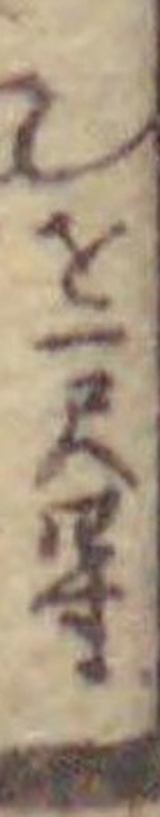を一尺四寸
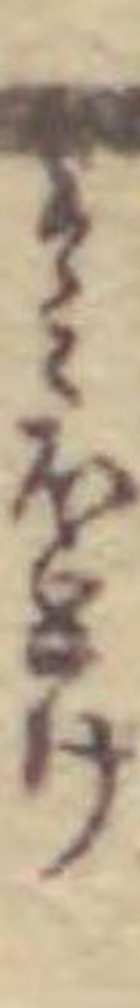かみほとけ
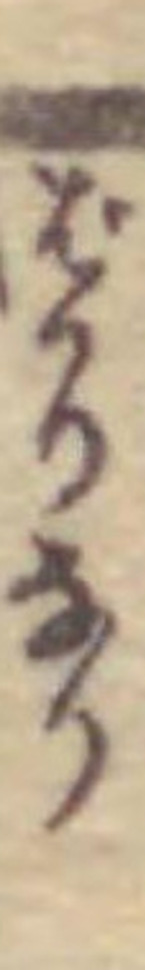ばかりなり
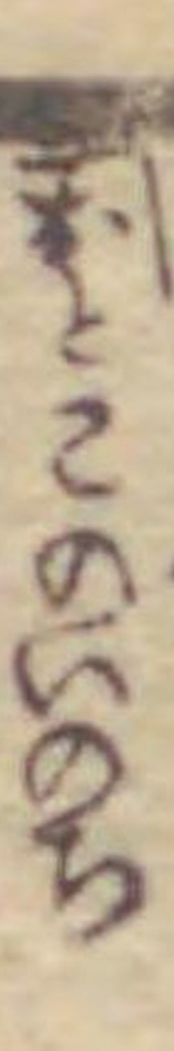〽おとこのいのち
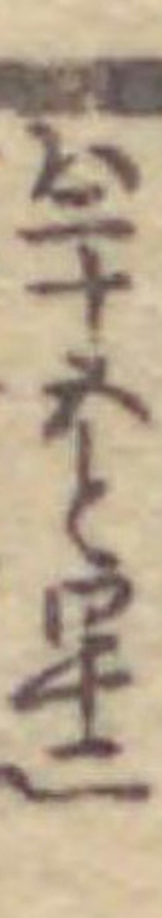は二十五と四十二
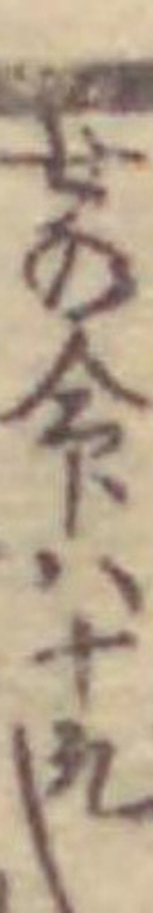女の命は十九
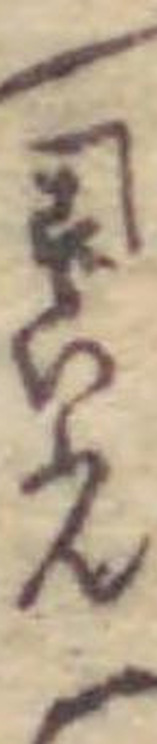〽ずいふん
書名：御誂染長寿小紋 : 3巻
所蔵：国立国会図書館 National Diet Library, JAPAN
